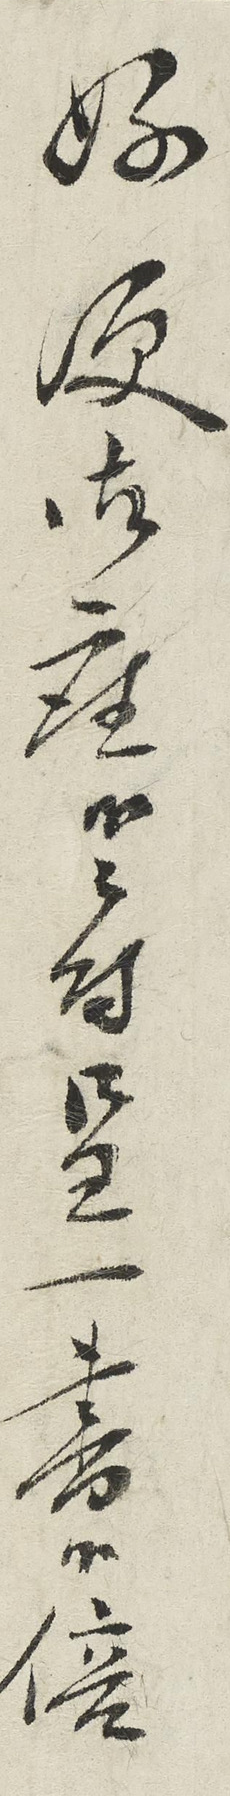好便御座候ニ付呈一書候倍
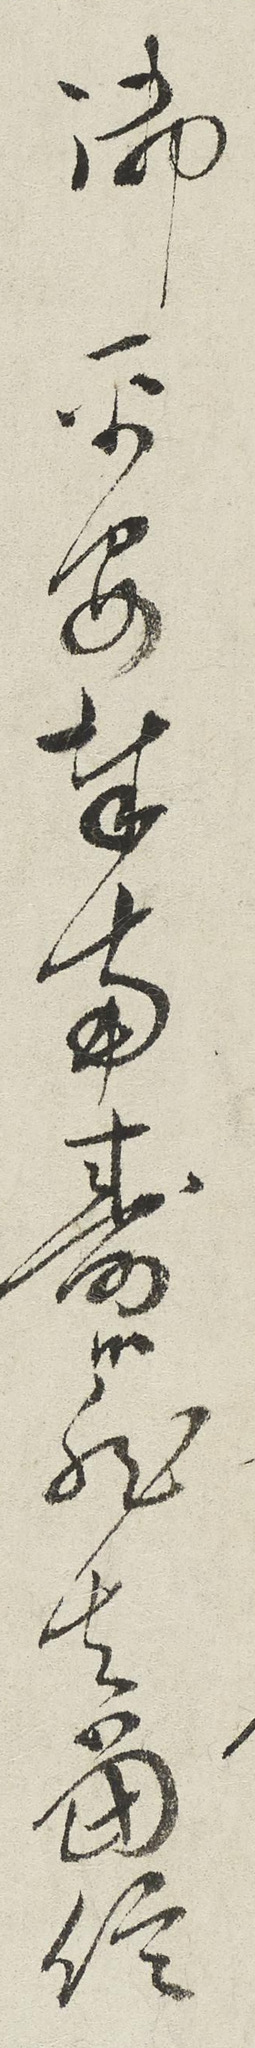御平安奉南寿候然者当信
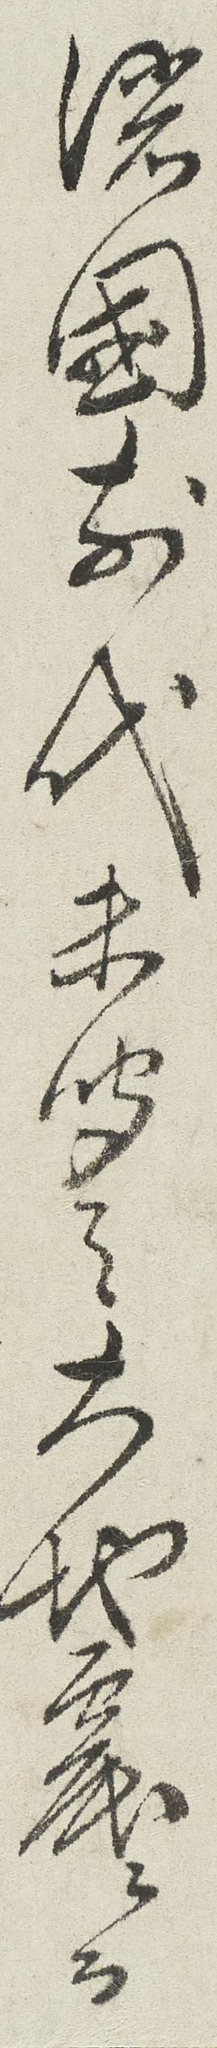濃国前代未聞之大地震二而
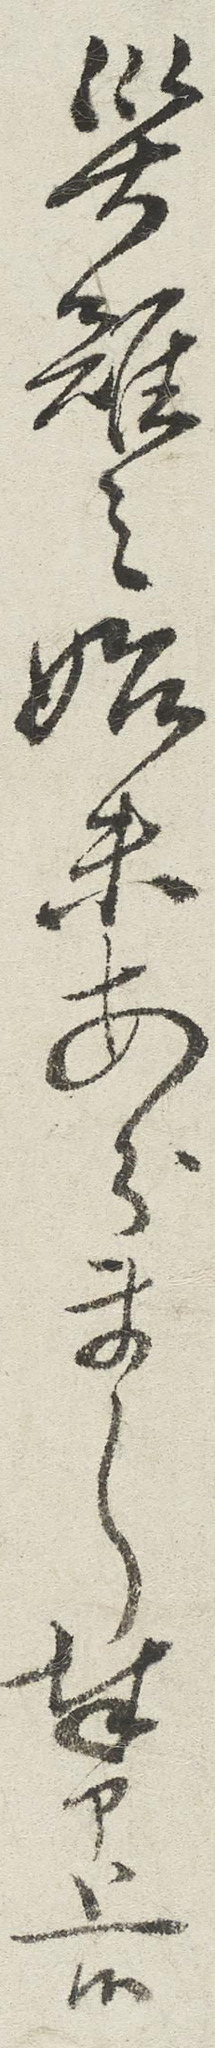災難之始末あらまし奉申上候
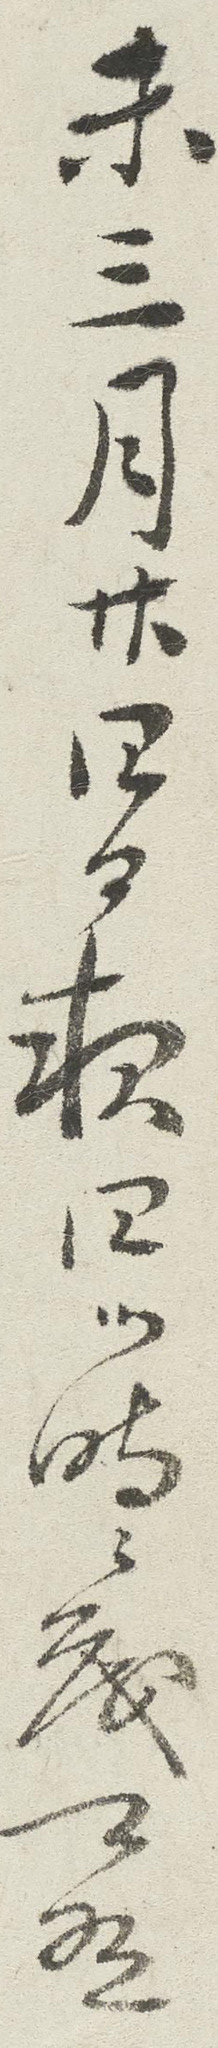未三月廿四日夜四ツ時ニも可有
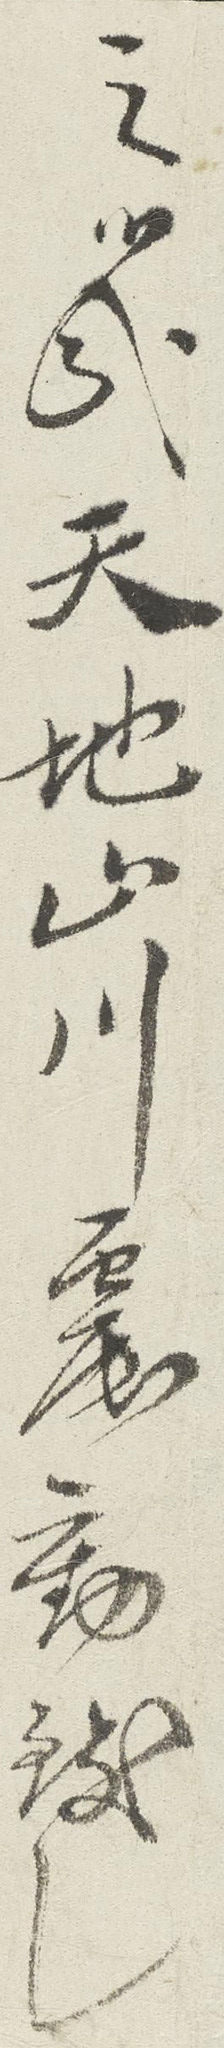之候哉天地山川震動致し
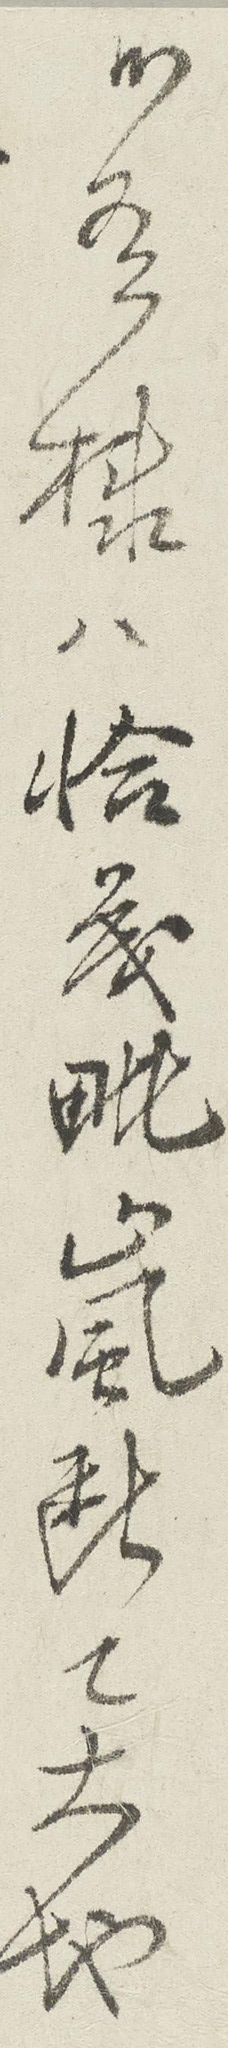候有様は恰も毘嵐断て大地
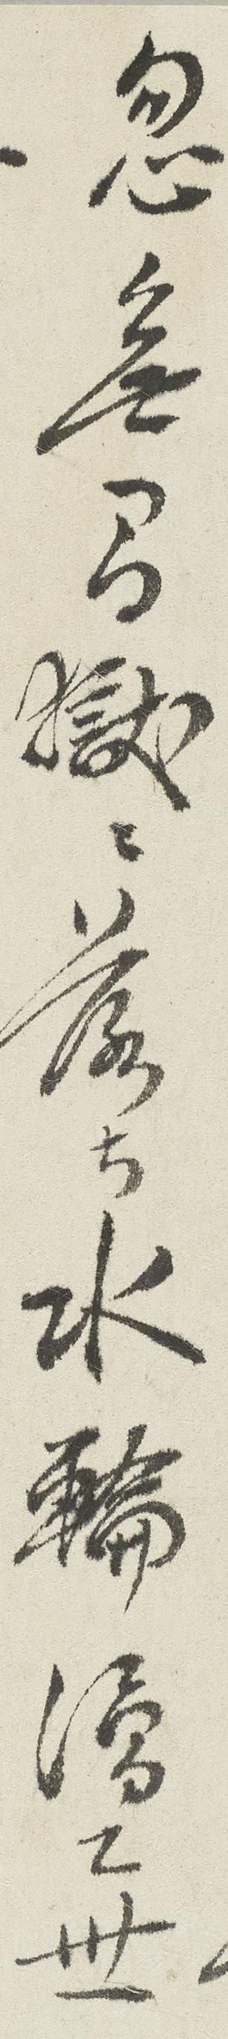忽無間獄ニ落ち水輪湧て世
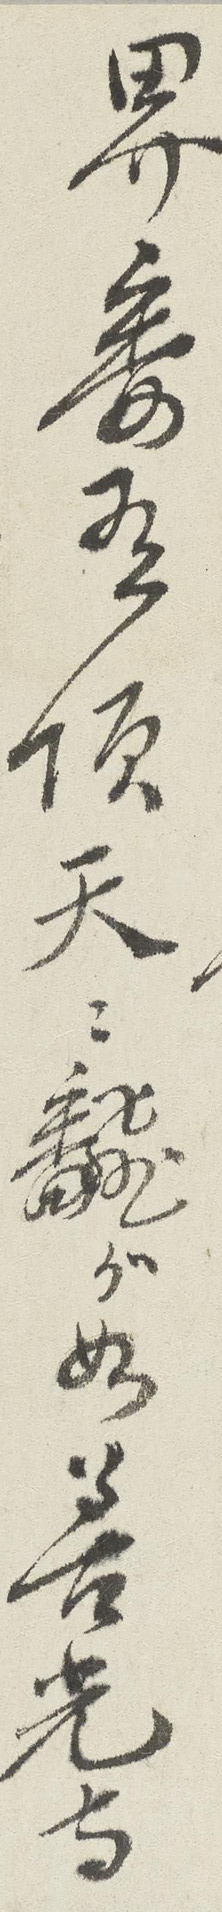界悉有頂天ニ翻が如善光寺
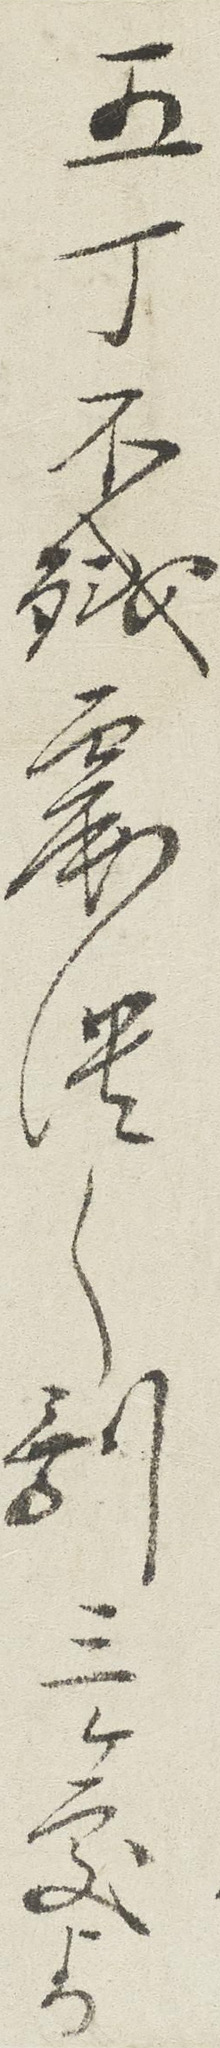五丁不残震潰候剰三ケ処より
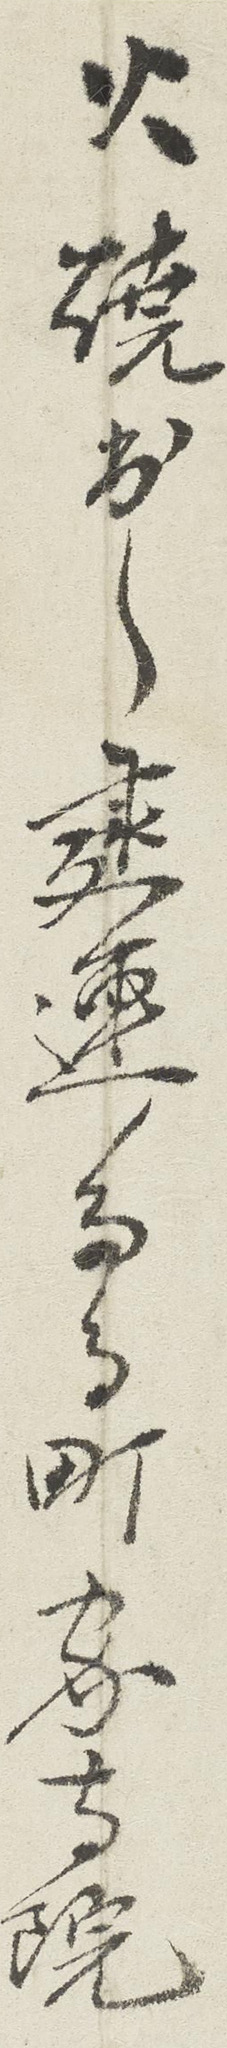火焼出し建連たる町家寺院
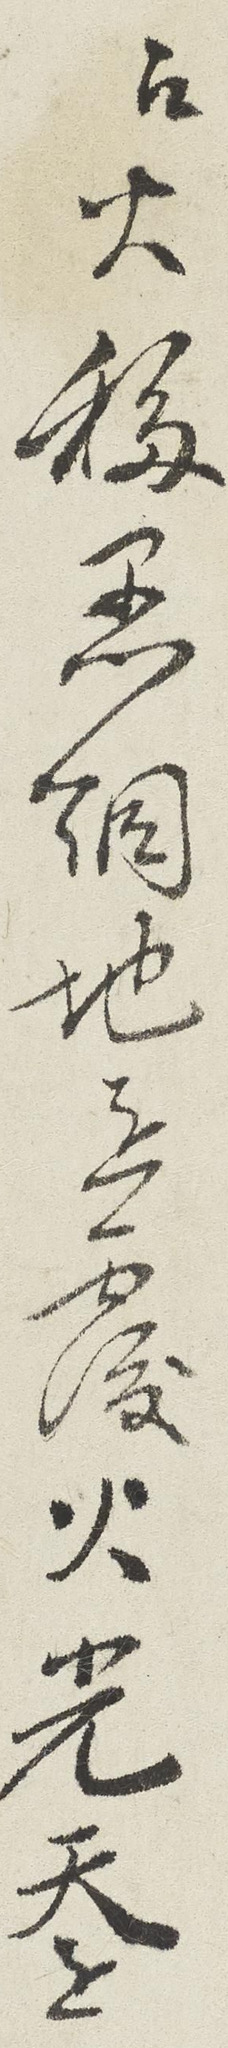え火移黒煙地を覆火光天を
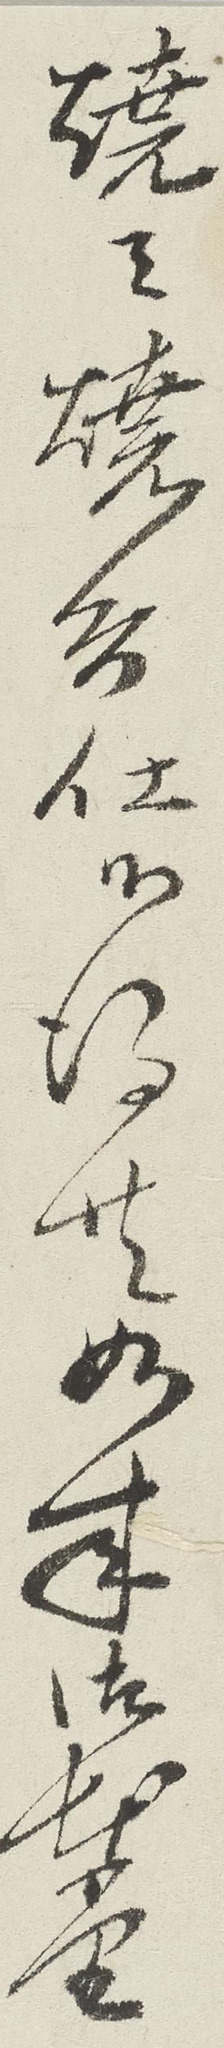焼て焼失仕候得共如来御本堂
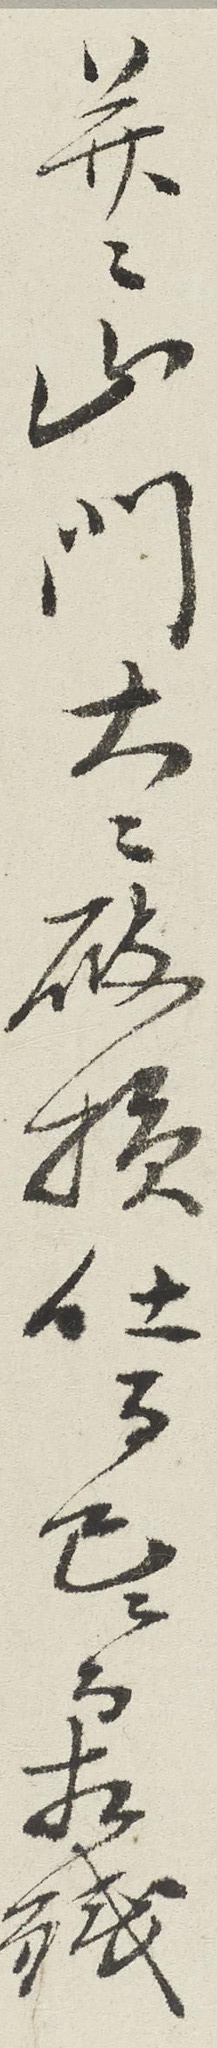幷ニ山門大ニ破損仕而已ニ而相残
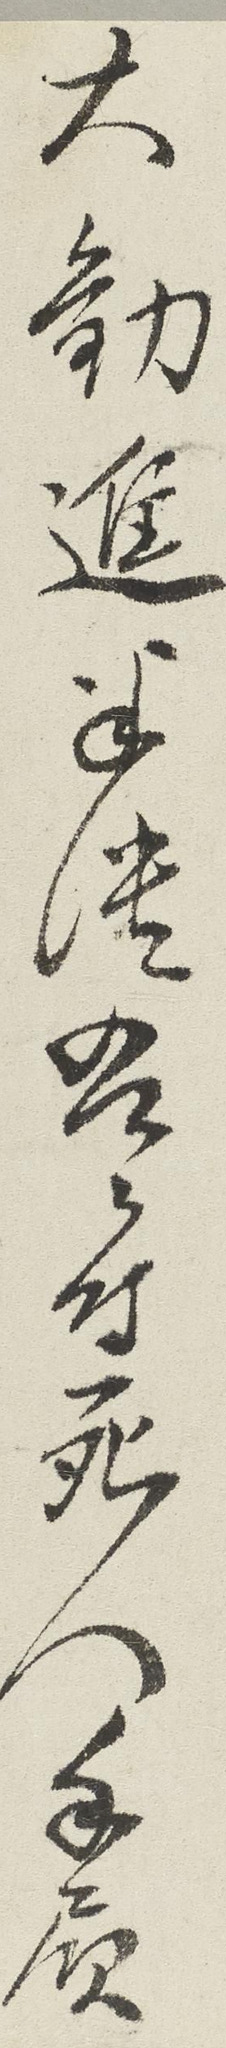大勧進半潰有ニ付死人手負
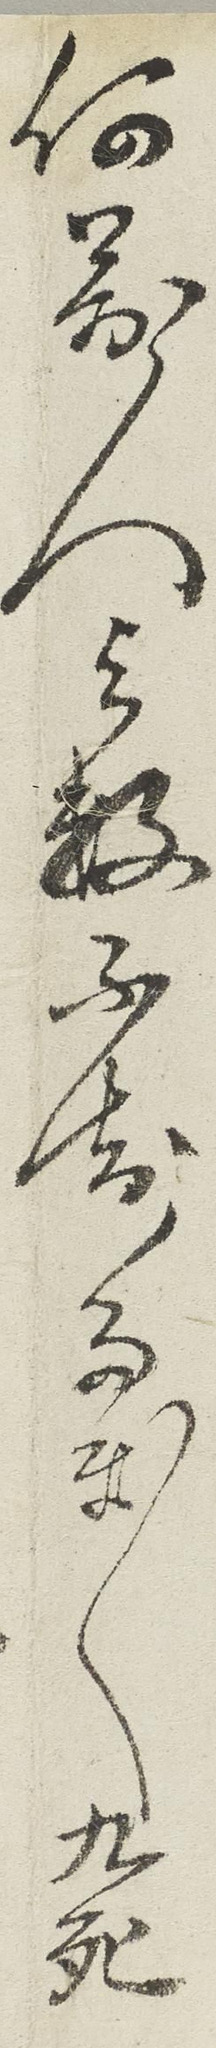何万人と数不知たま〳〵九死
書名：[善光寺地震に関する書状]
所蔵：東京大学地震研究所図書室 Earthquake Research Institute Library, The University of Tokyo, JAPAN
